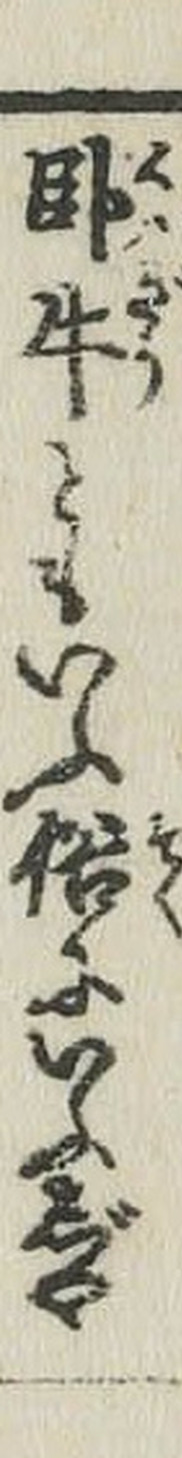臥牛ともいふ俗にいふじや
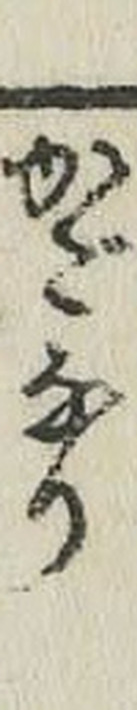かごなり
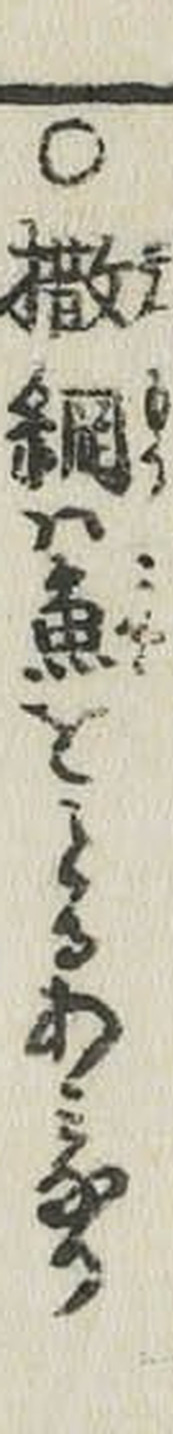○撒網は魚をとるあみなり
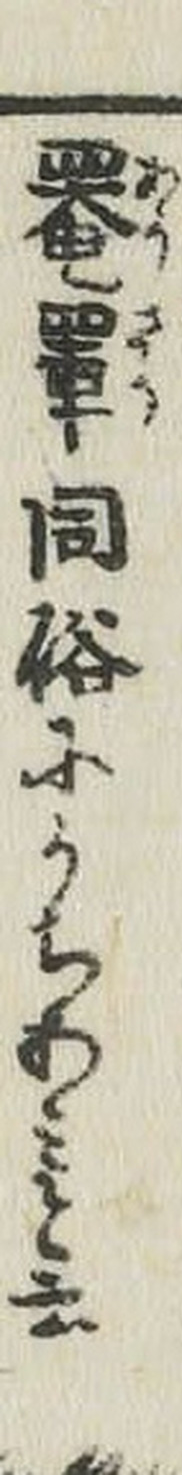罨罩同俗にうちあみと云
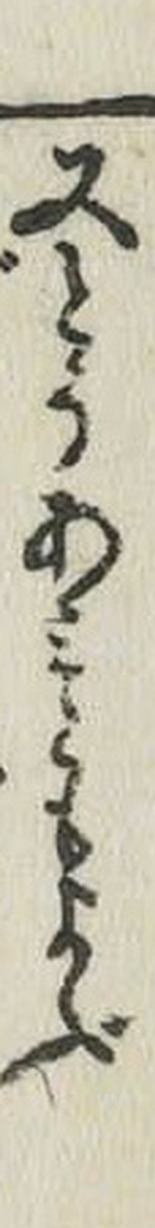又とうあみともよぶ
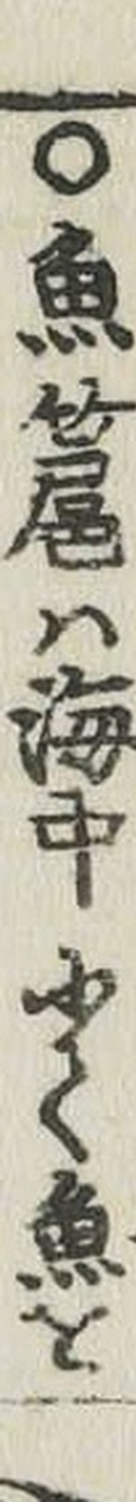○魚簄は海中にて魚を
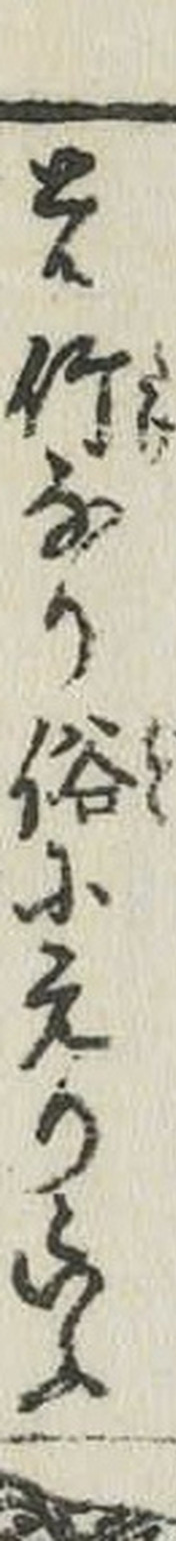とる竹なり俗にえりといふ
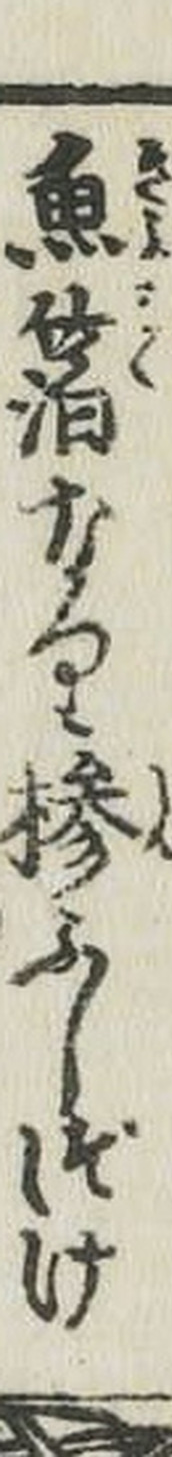魚箔なり槮ふしづけ
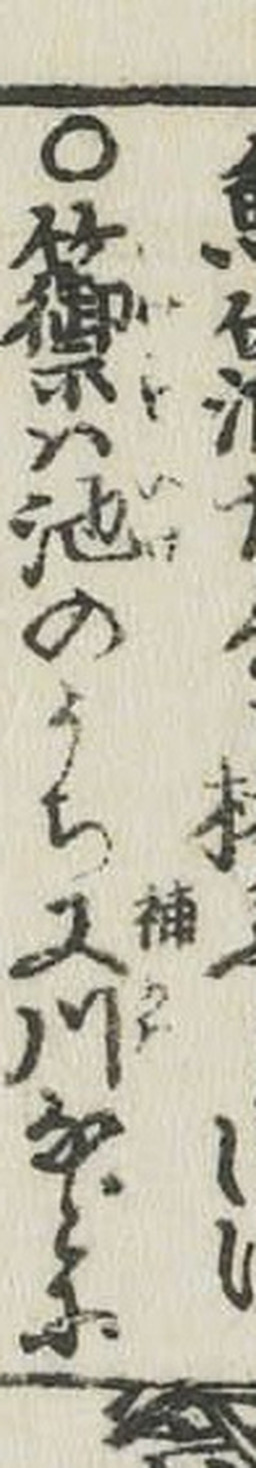○籞は池のうち又川などに
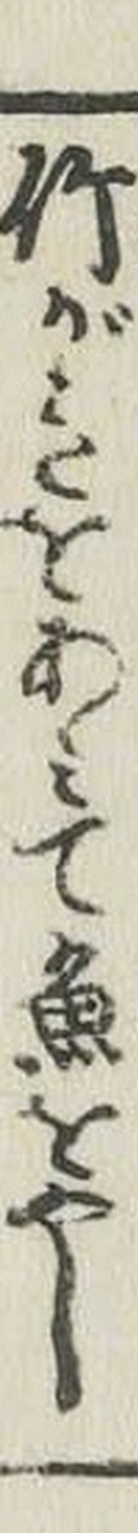竹がきをあみて魚をやし
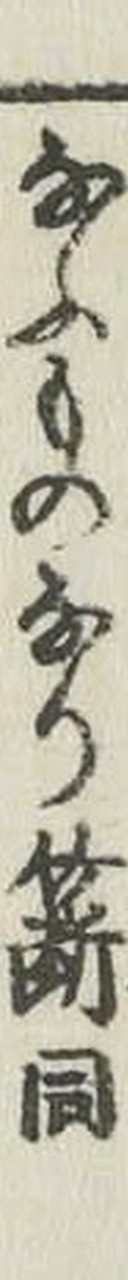なふものなり簖同
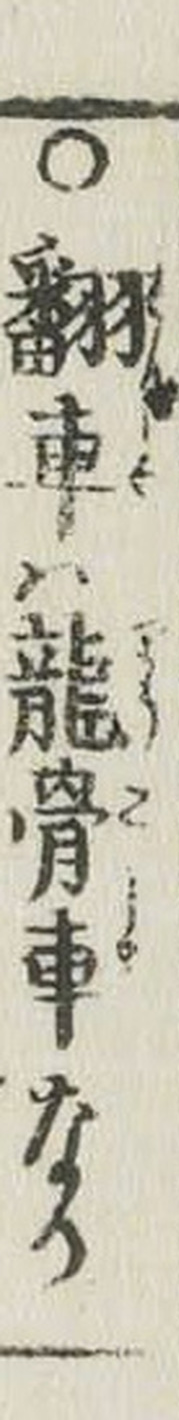○翻車は龍骨車なり
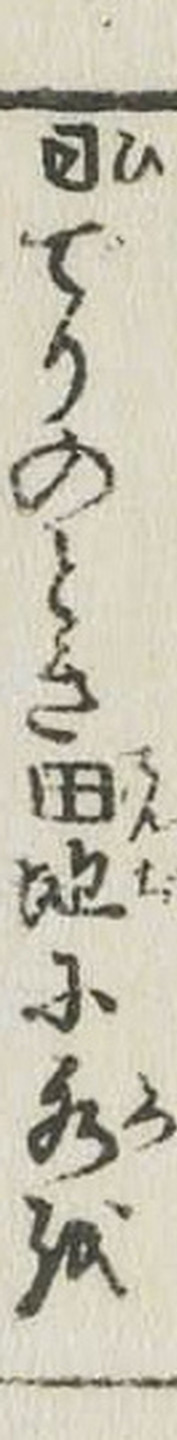日でりのとき田地に水を
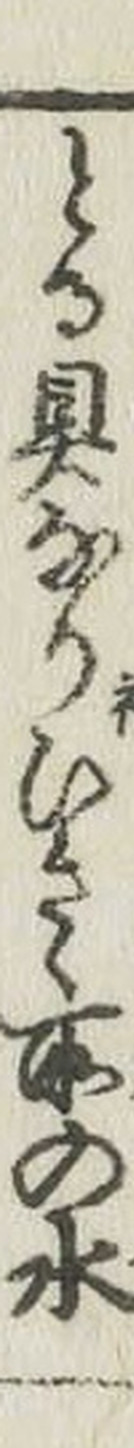とる具なりひきく所の水
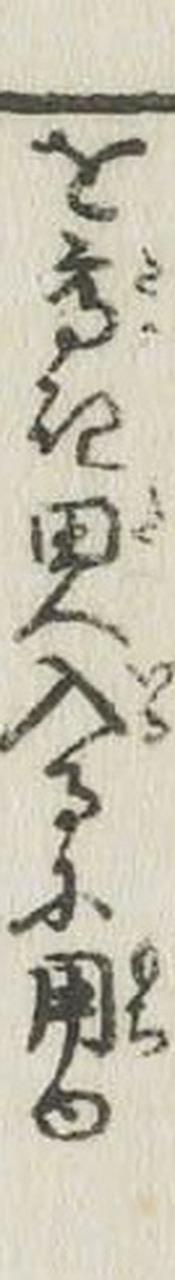を高き田へ入るに用ゆ
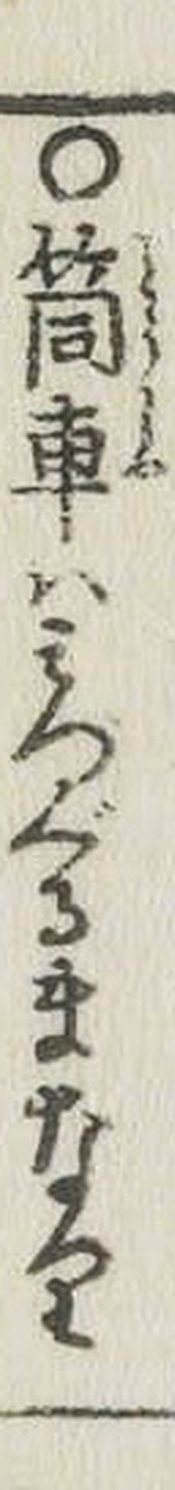○筒車はみづぐるまなり
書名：増補頭書訓蒙図彙大成 10巻 5:巻之9-11
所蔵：東京学芸大学教育コンテンツアーカイブ
